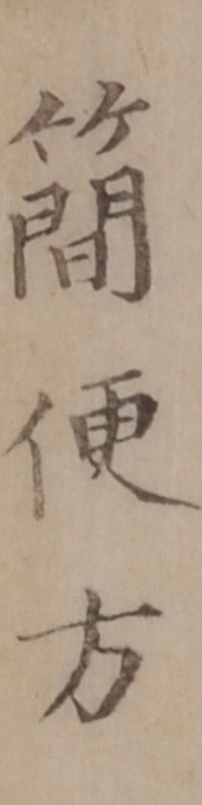簡便方

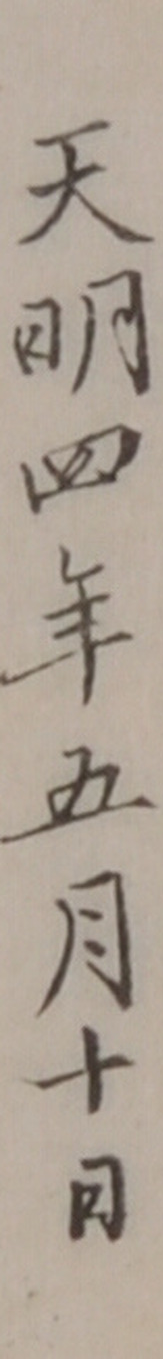天明四年五月十日
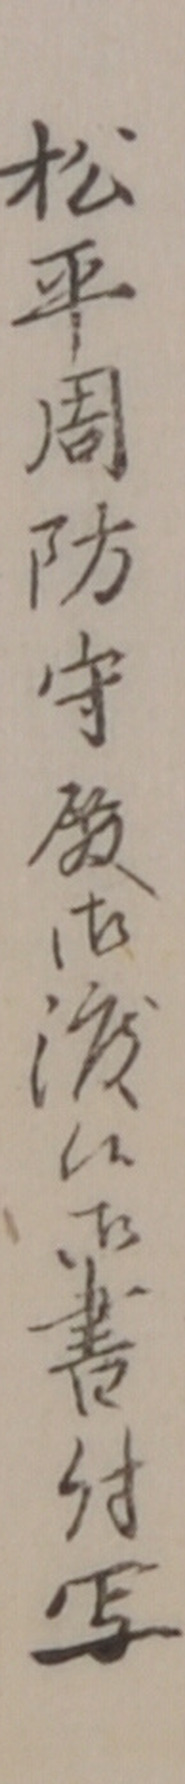松平周防守殿御渡候御書付写
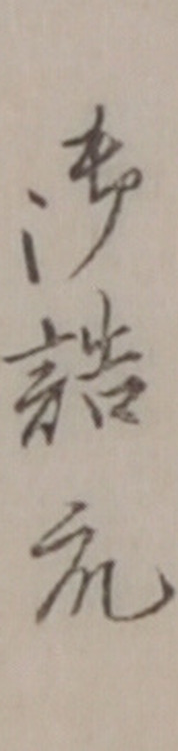御詰衆
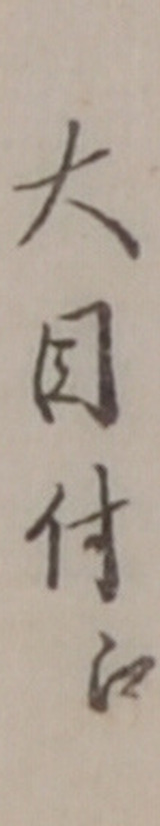大目付江
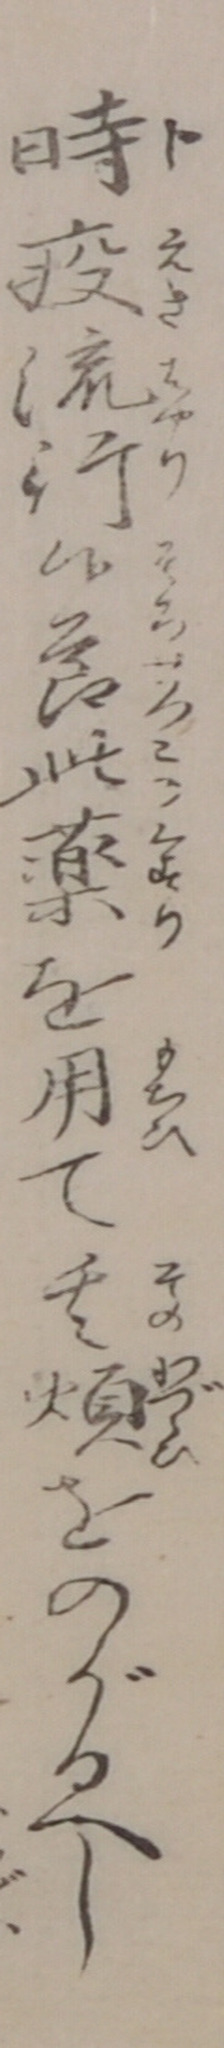時疫流行候節此薬を用て其煩をのがるへし
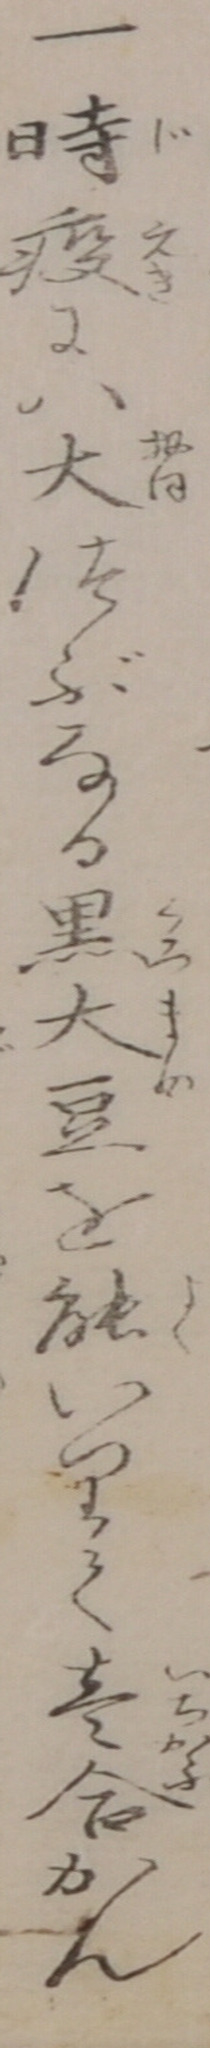一時疫には大つぶなる黒大豆を能いりて壱合かん
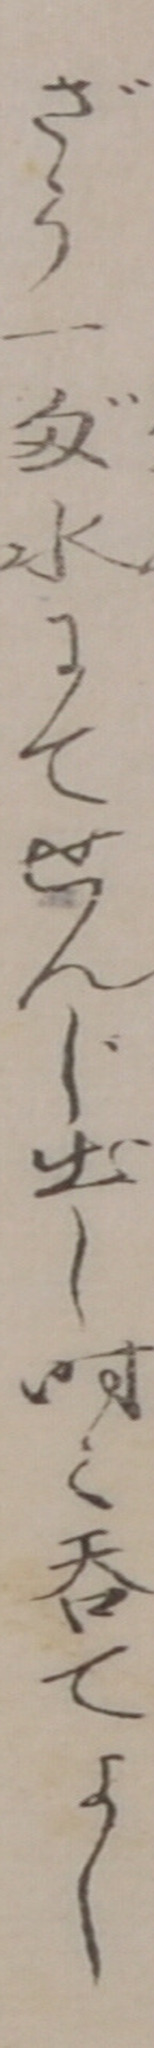ざう一匁水にてせんじ出し時〳〵呑てよし
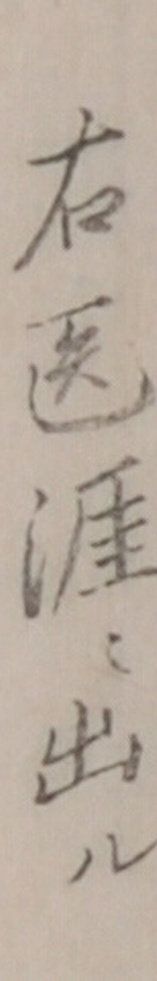右医涯に出ル

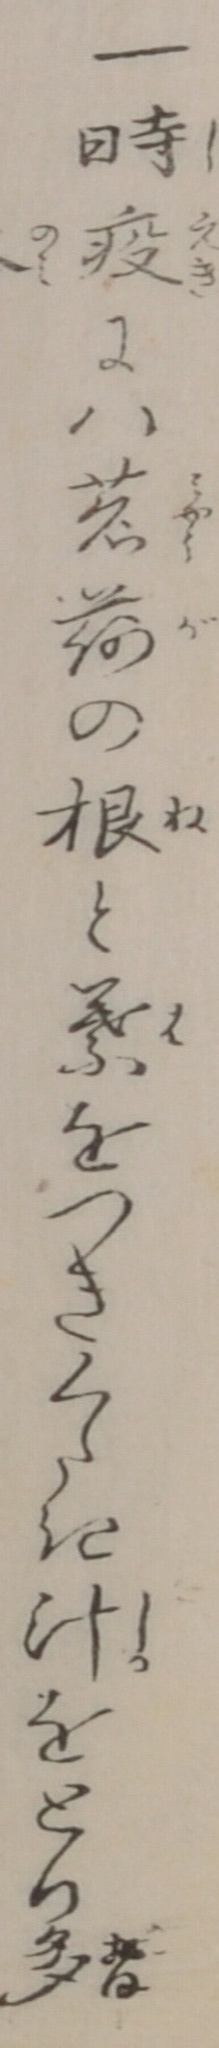一時疫には茗荷の根と葉をつきくたき汁をとり多
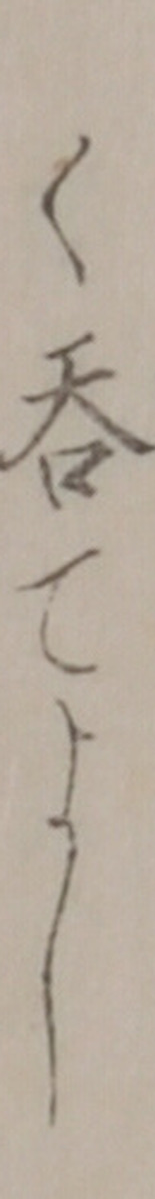く呑てよし
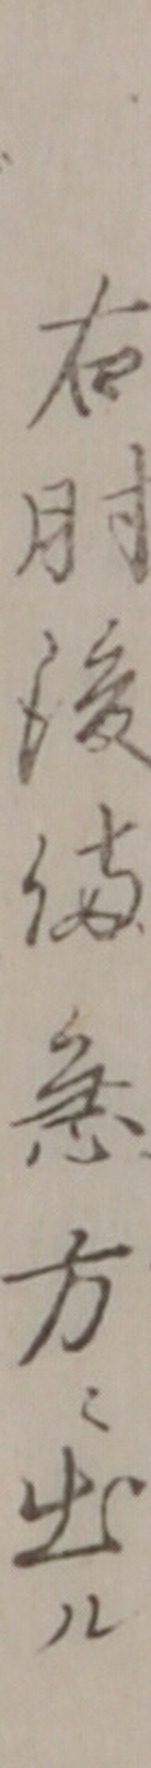右肘後備急方に出ル
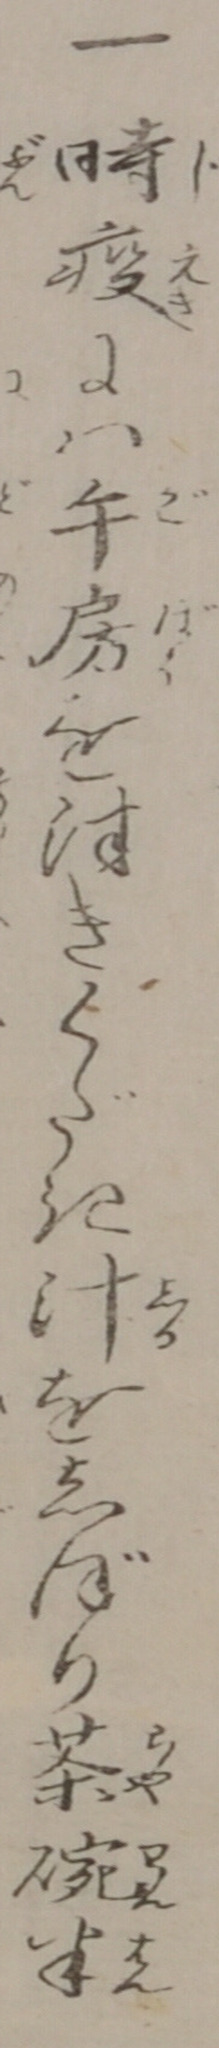一時疫には午房をつきくだき汁をしぼり茶碗半
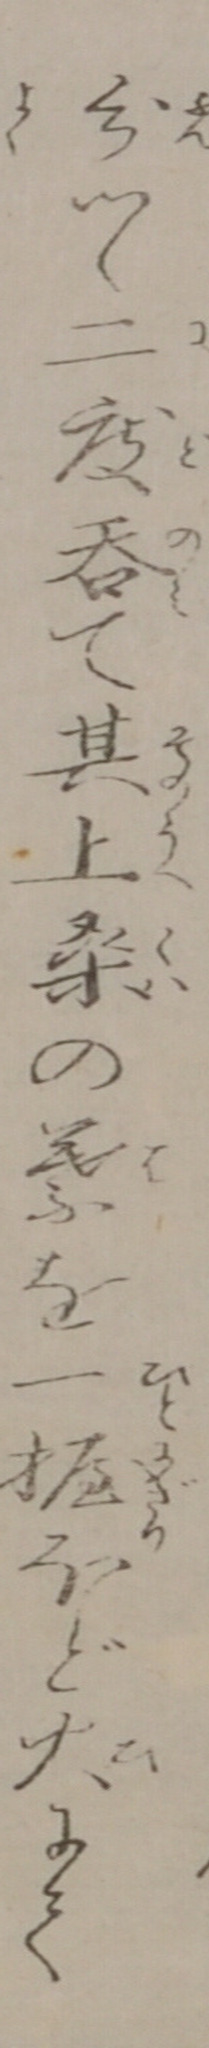分ツゝ二度呑て其上桑の葉を一握ほど火にて
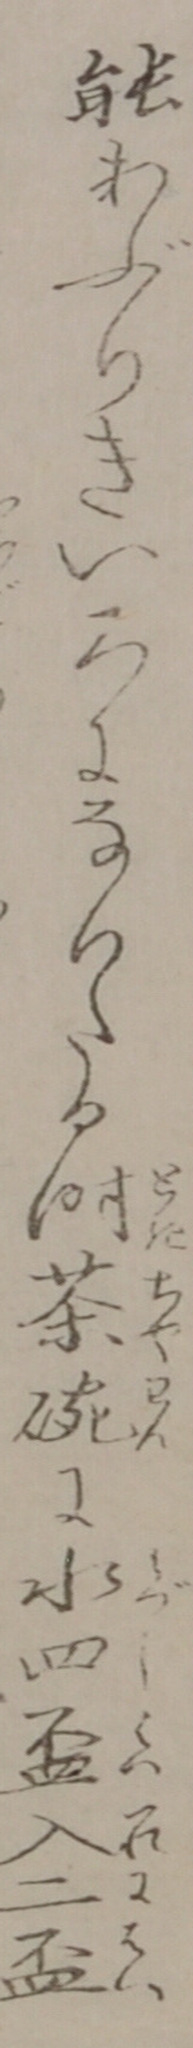能あぶりきいろになりたる時茶碗に水四盃入二盃
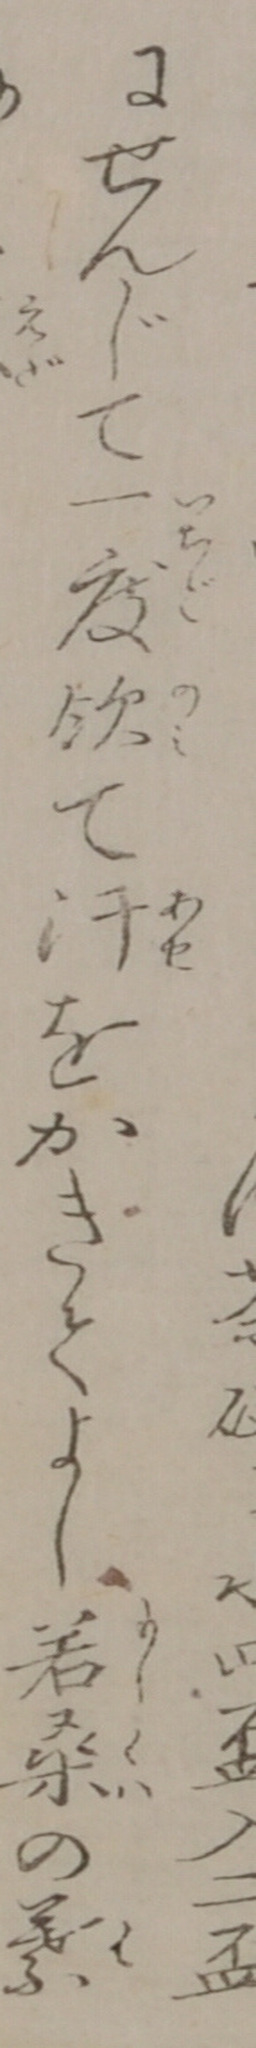にせんじて一度飲て汗をかきてよし若桑の葉
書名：簡便方
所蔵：伊那市立高遠町図書館・合同会社AMANE
